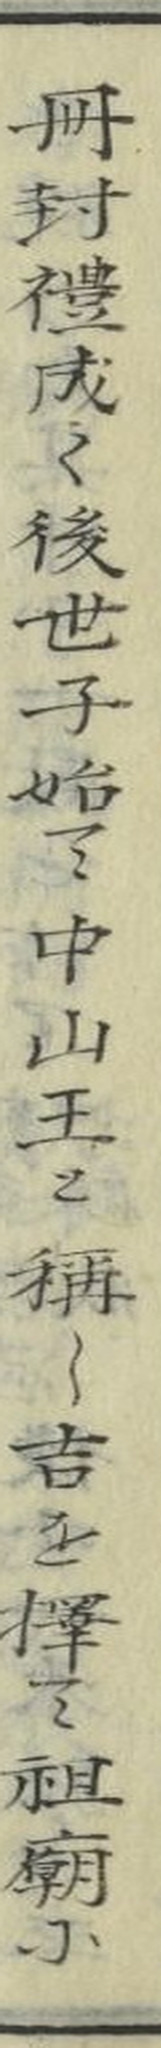冊封礼成て後世子始て中山王と称し吉を択て祖廟に
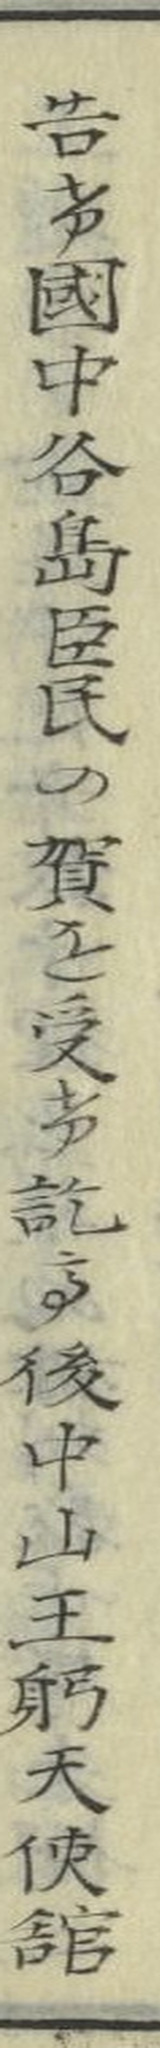告け国中各島臣民の賀を受け訖て後中山王躬天使館
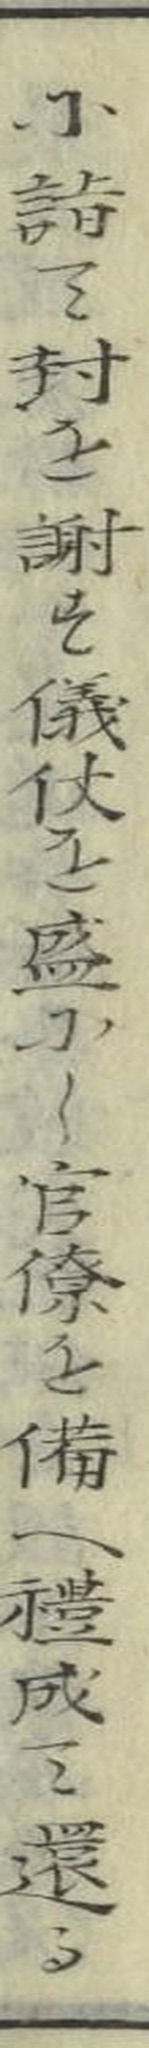に詣て封を謝す儀仗を盛にし官僚を備へ礼成て還る

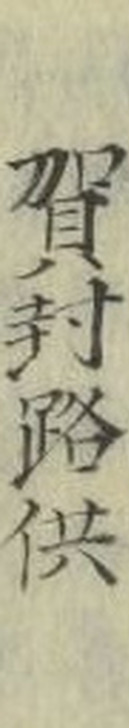賀封路供
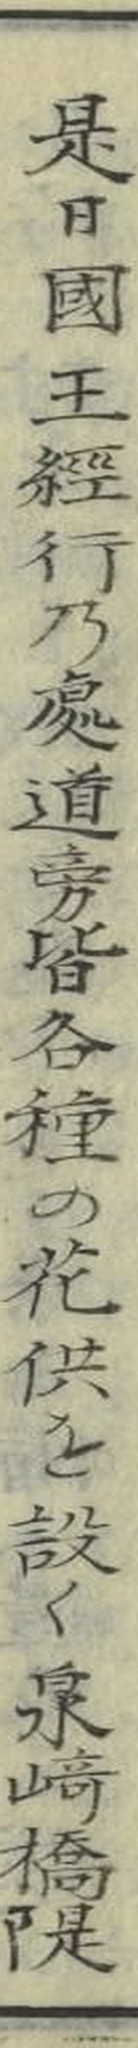是日国王経行の処道旁皆各種の花供を設く泉崎橋隄
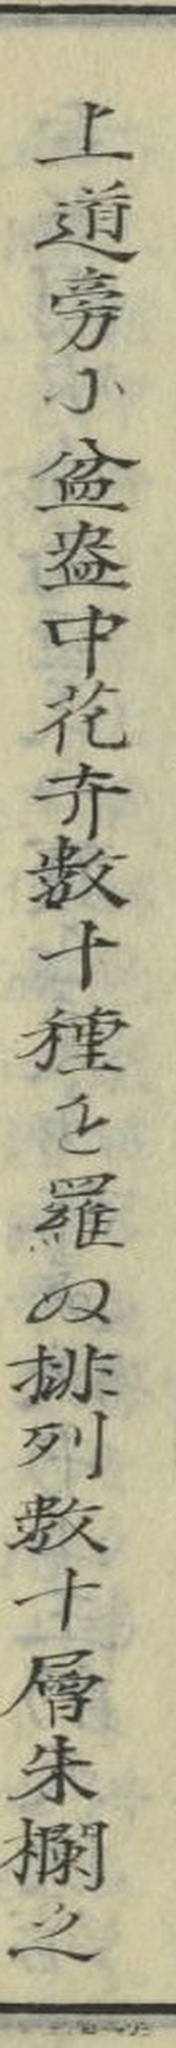上道旁に盆盎中花卉数十種を羅ぬ排列数十層朱欄之
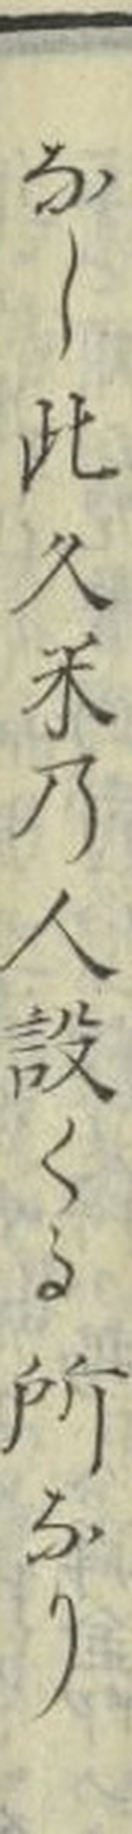なし此久米の人設くる所なり
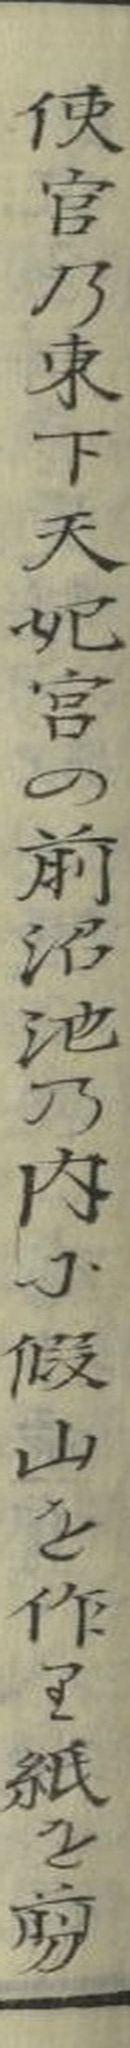使官の東下天妃宮の前沼地の内に仮山を作り紙を剪
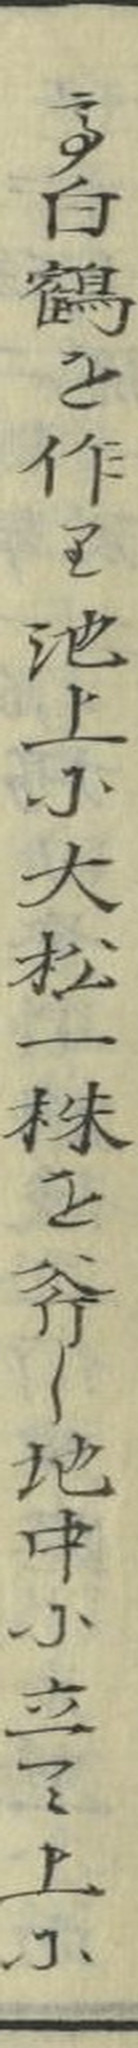て白鶴を作り池上に大松一株を斧し地中に立て上に
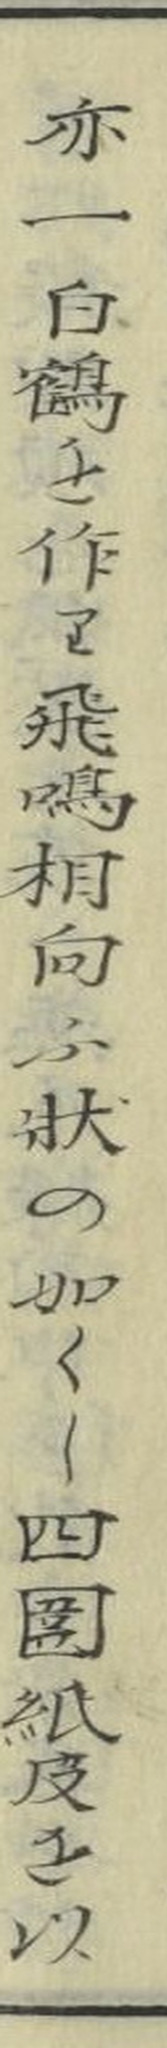亦一白鶴を作り飛鳴相向ふ状の如くし四囲紙皮を以
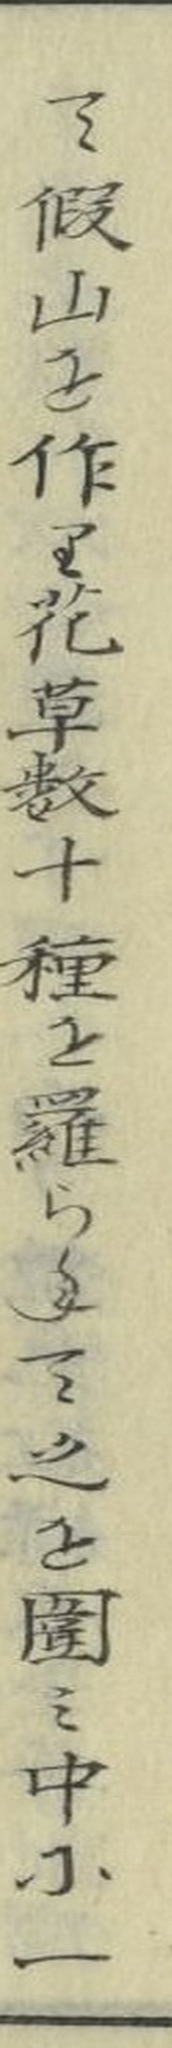て仮山を作り花草数十種を羅らねて之を囲み中に一
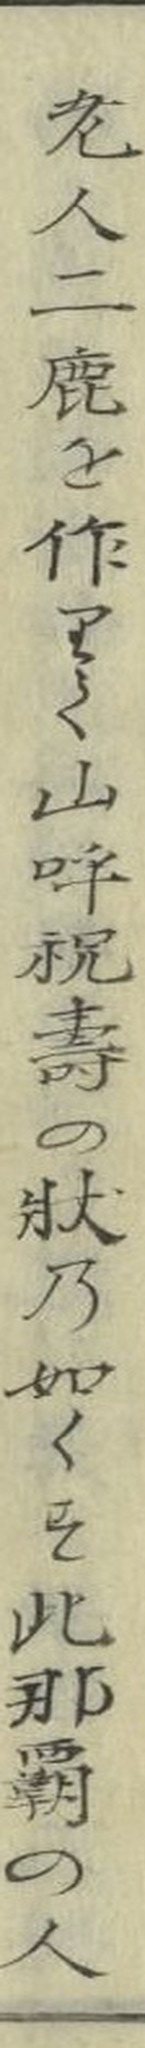老人二鹿を作りて山呼祝寿の状の如くす此那覇の人
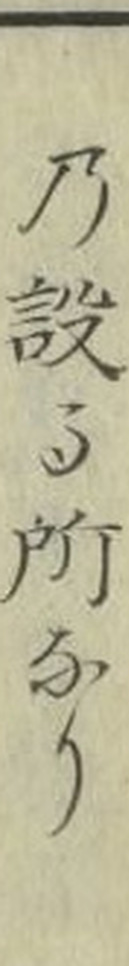の設る所なり
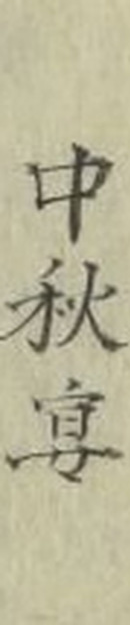中秋宴
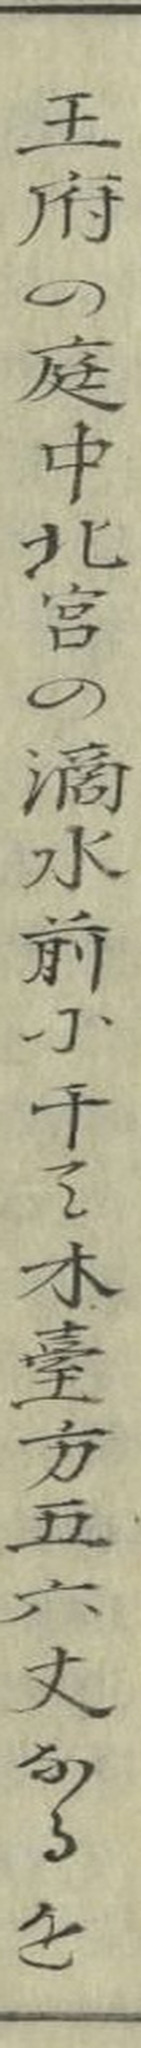王府の庭中北宮の滴水前に于て木台方五六丈なるを
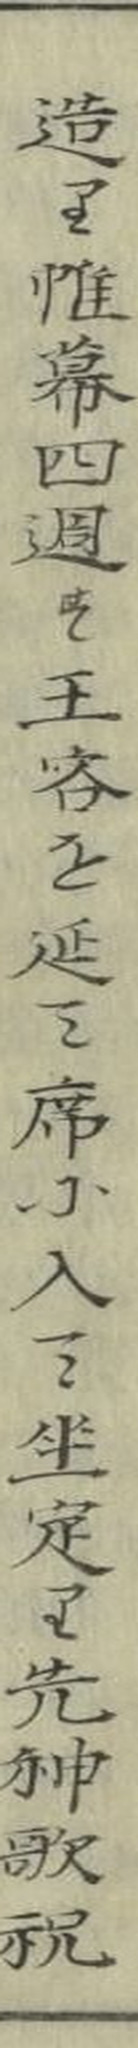造り帷幕四週す王客を延て席に入て坐定り先神歌祝
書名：琉球沿革志 下
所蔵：University of the Ryukyus Library
